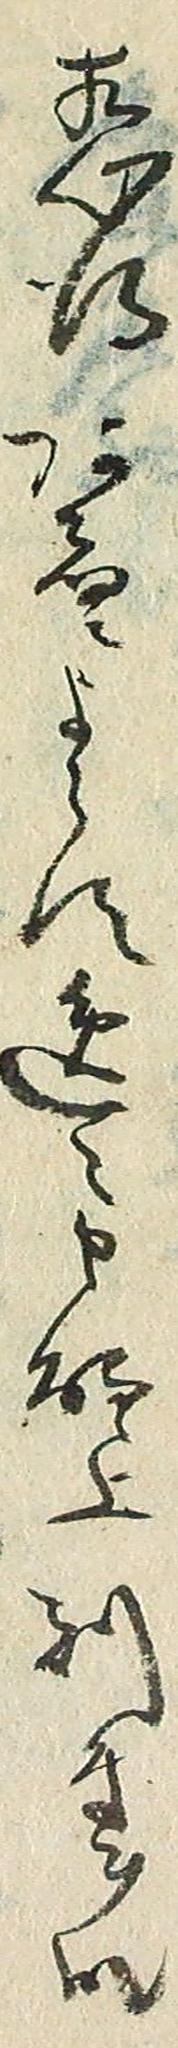相心得何者によらす逸々申触候上刻付けを以
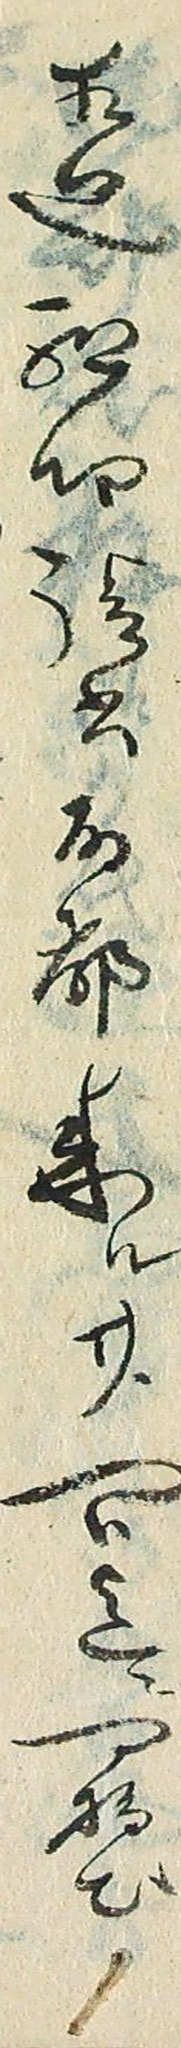相廻組切請書取都来る廿一日迄に可指出
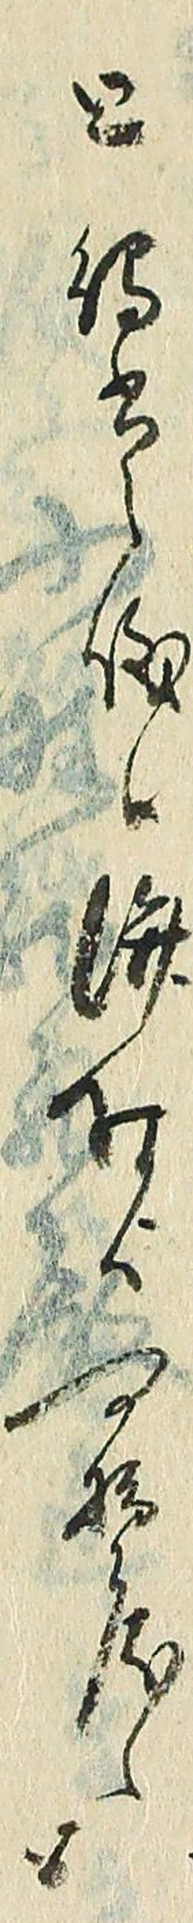且触書之儀は済村ゟ可指戻候以上
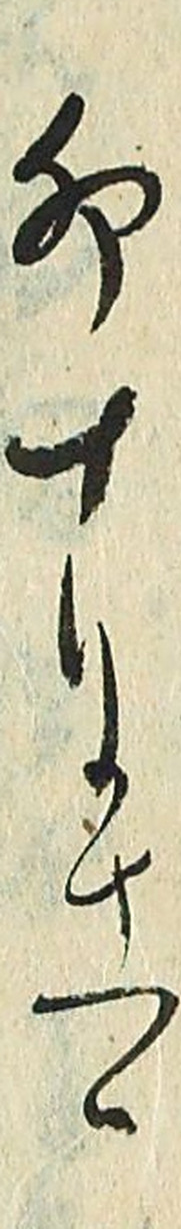卯十月十一日
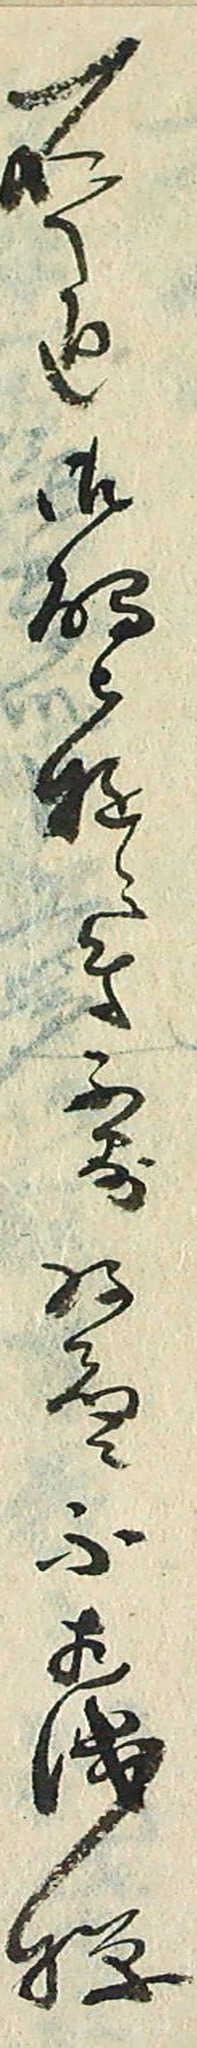右之通御触被遊候に付不寄何者に不洩様
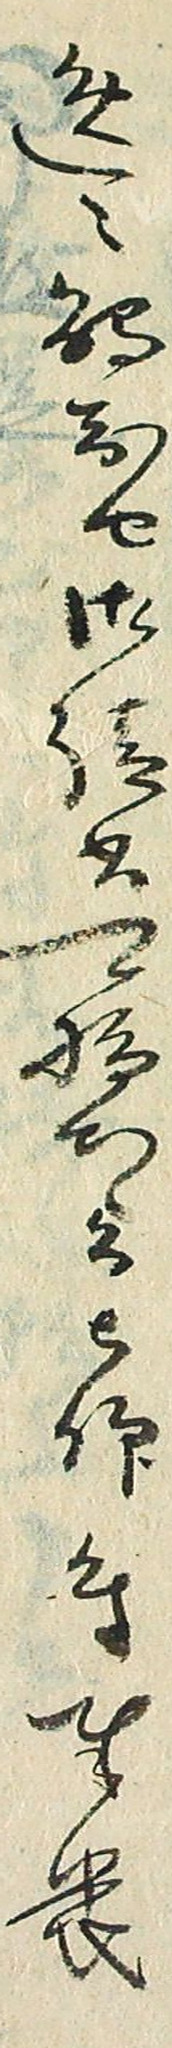逸々触知せ御請書可指出旨被仰付奉畏
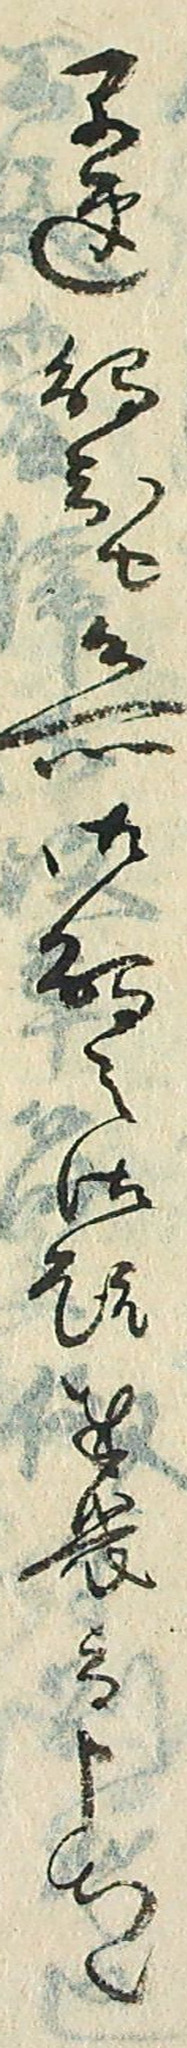早速触知せ候所御触之御趣奉畏旨申出候
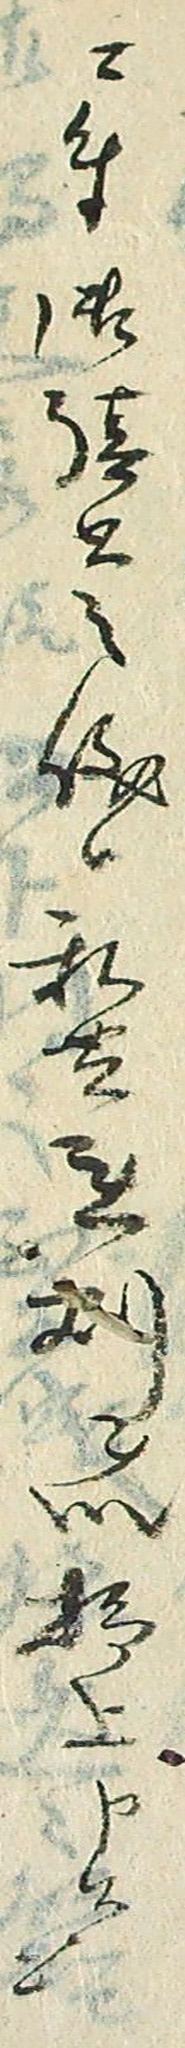に付御請書之儀は私共連判を以指上申候以上
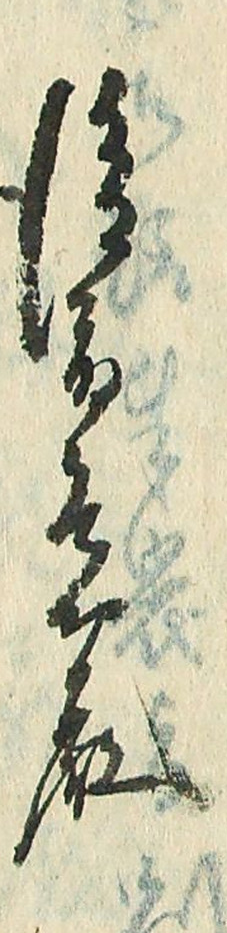後藤庄助殿

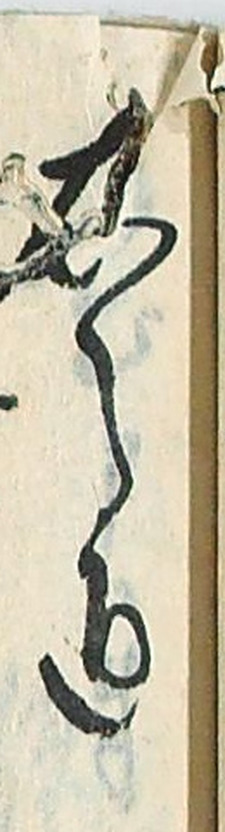右之通
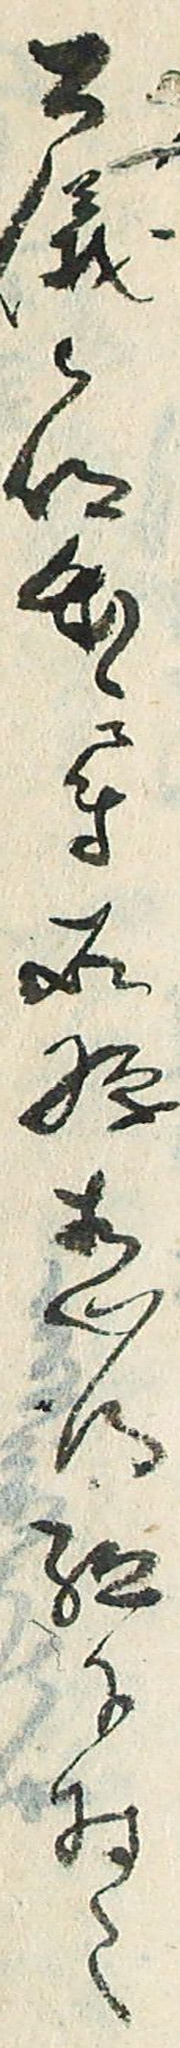公義被仰出候に付右様相心得組下村々
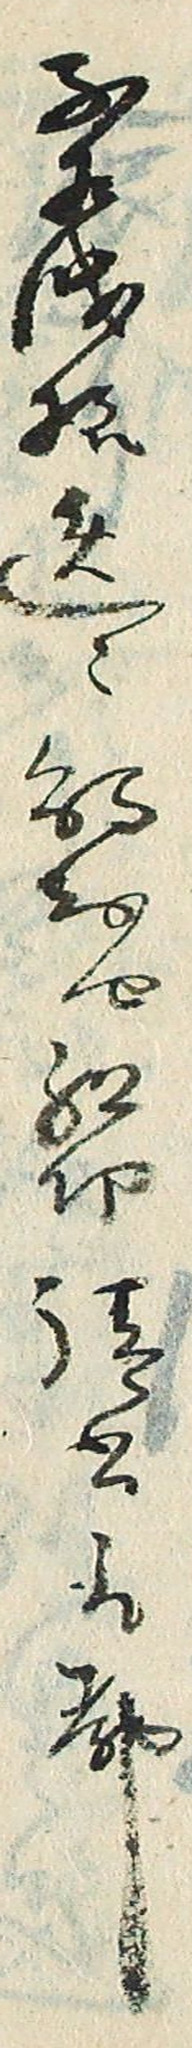不洩様逸々触知せ組切請書取都
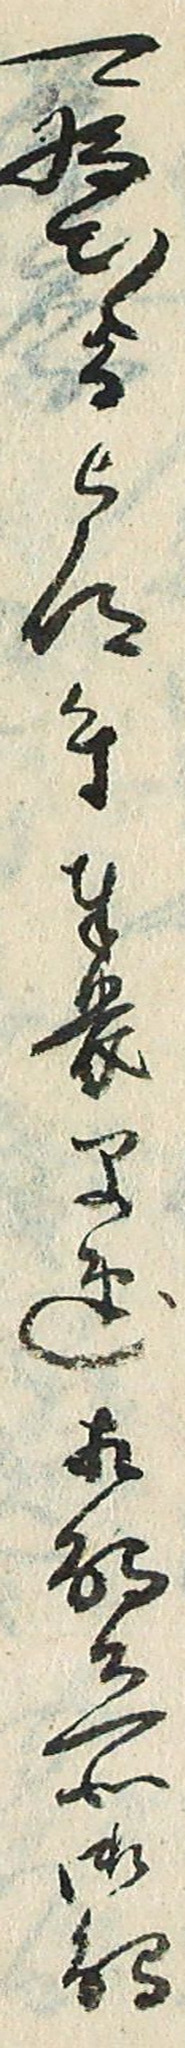可指出旨被仰付奉畏早速相触候所御触
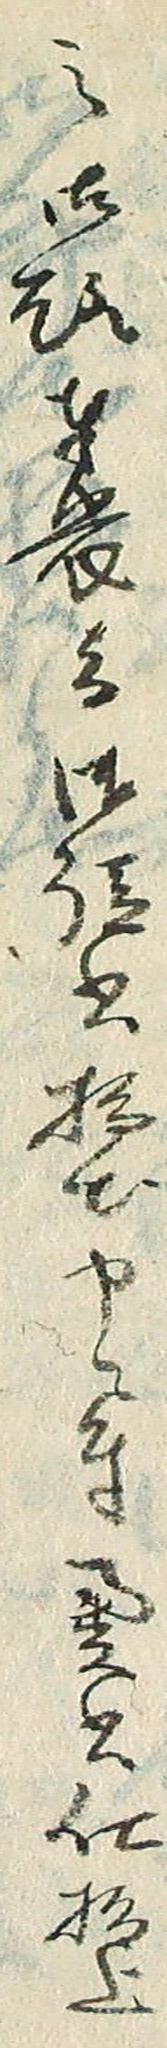之御趣奉畏旨御請書指出申に付奥書仕指上
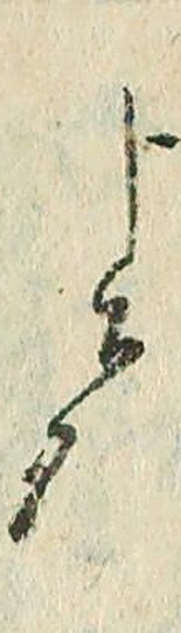申候以上
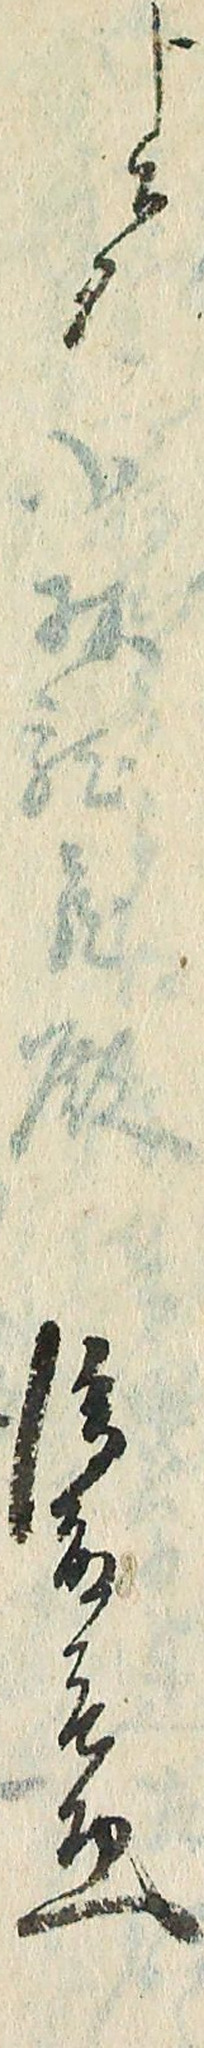後藤庄助
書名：諸御用御□受書控
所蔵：鳴門教育大学 Naruto University of Education
